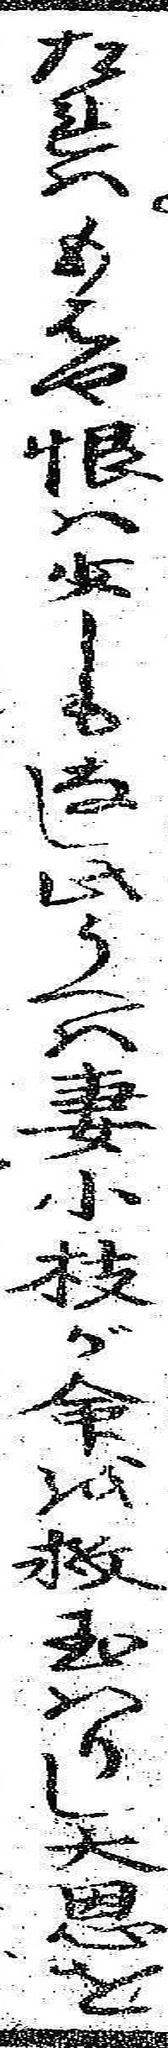たれは。もはや恨は少しもなし。此うへは妻小枝が命を救玉はりし。大恩を
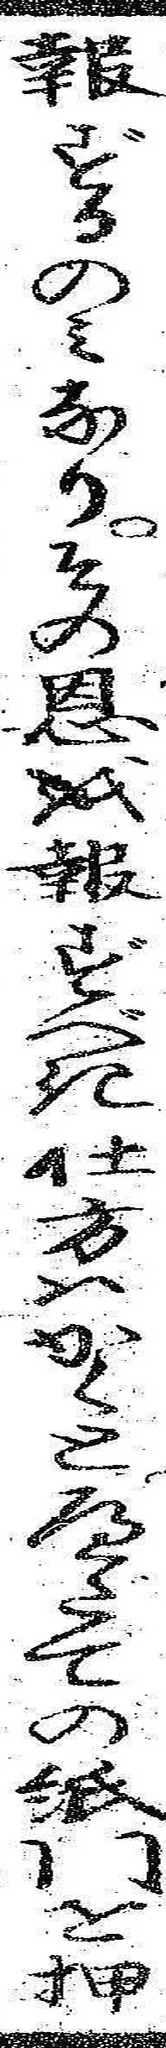報ずるのみなり。その恩を報ずべき仕方はかくと。へだての紙門を押
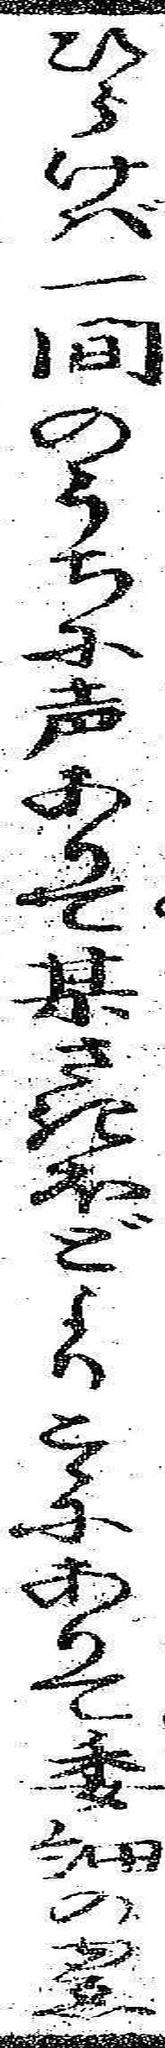ひらけば。一間のうちに声ありて。某さきほどよりこゝにありて。委細のゆゑ

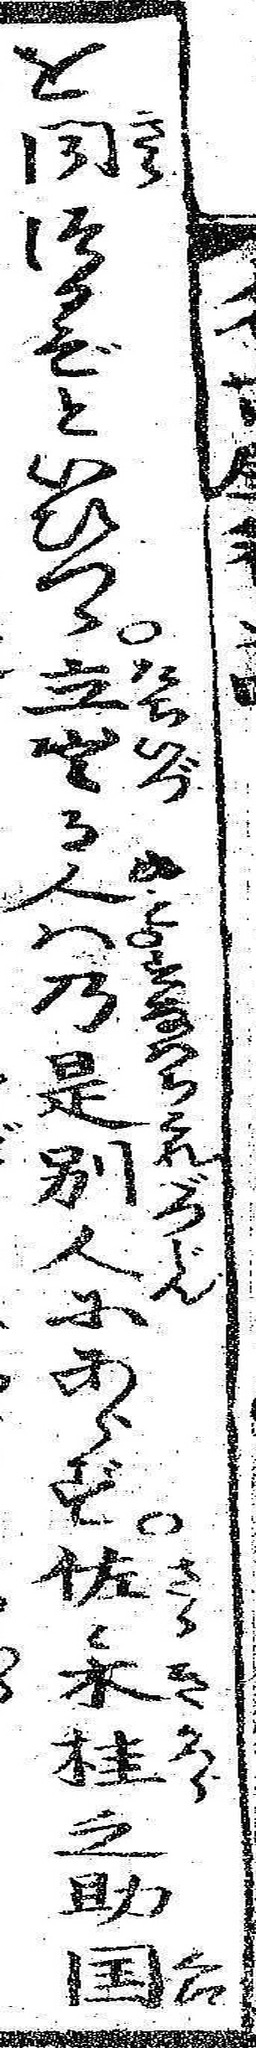を聞つるぞといひつゝ。立出る人は。乃是別人にあらず。佐々木桂之助国
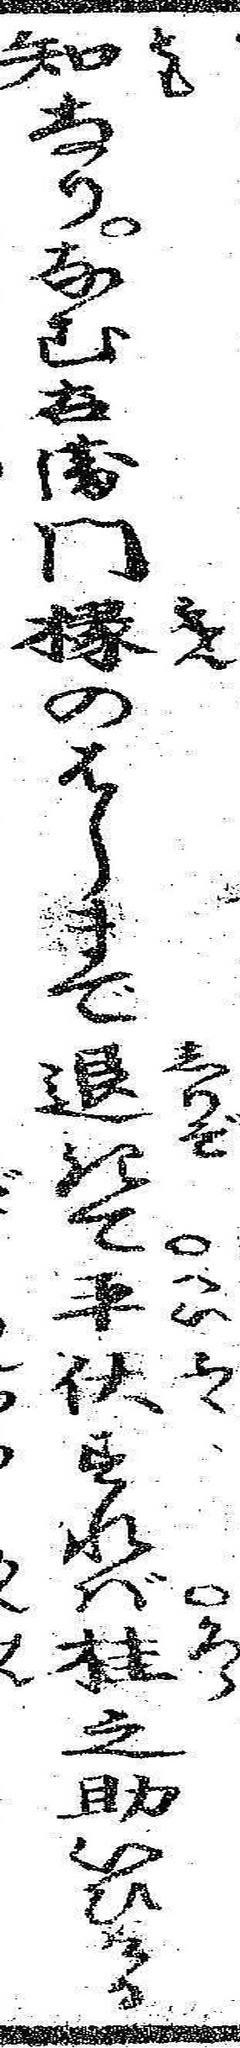知なり。なむ右衛門椽のはしまで退きて。平伏すれば。桂之助いひける
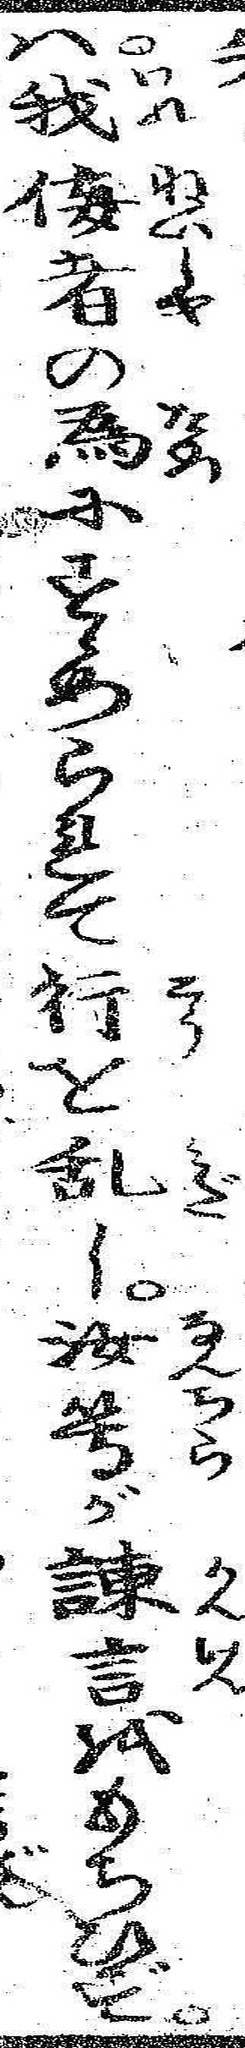は。我佞者の為にすゝめられて行を乱し。汝等が諌言をもちひず。
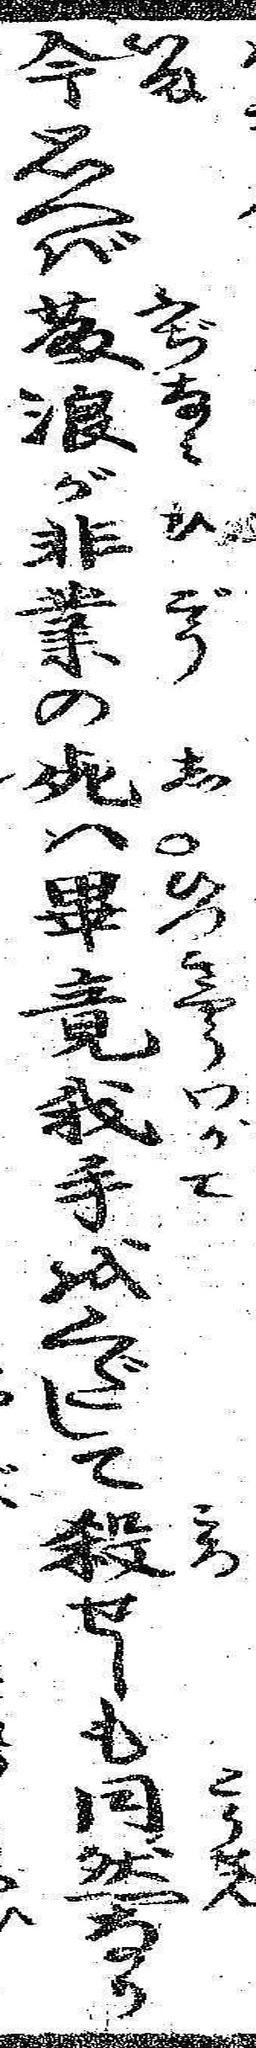今思へば藤浪が非業の死は。畢竟我手をくだして殺せしも同然なり
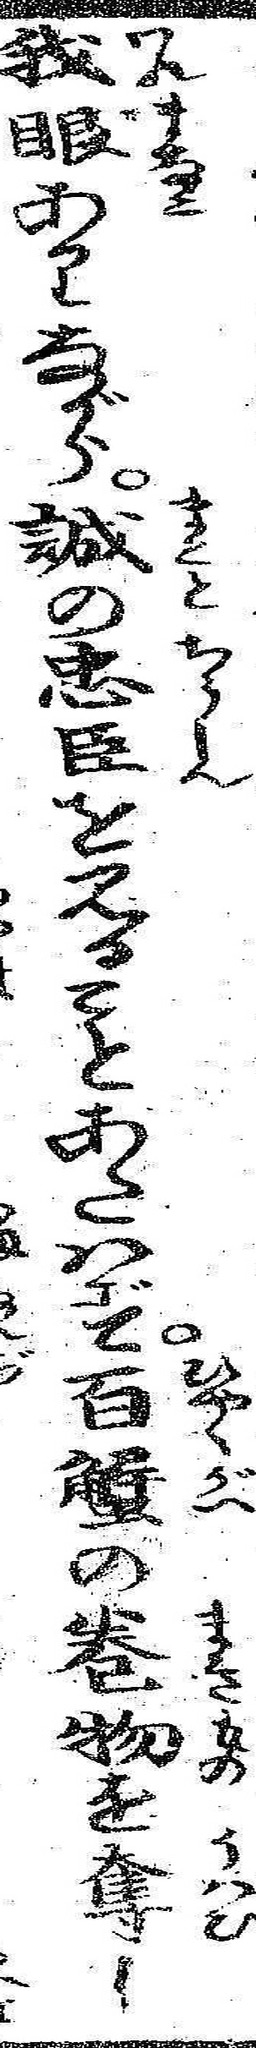我眼ありながら。誠の忠臣を見ることあたはず。百蟹の巻物を奪し
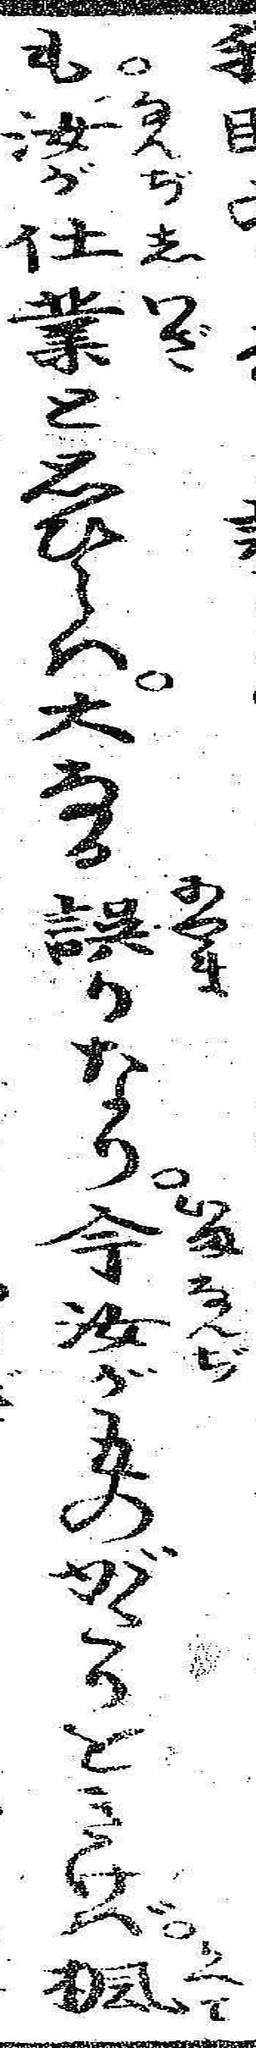も。汝が仕業と思ひしは。大なる誤りなり。今汝がものがたりをきけば。楓
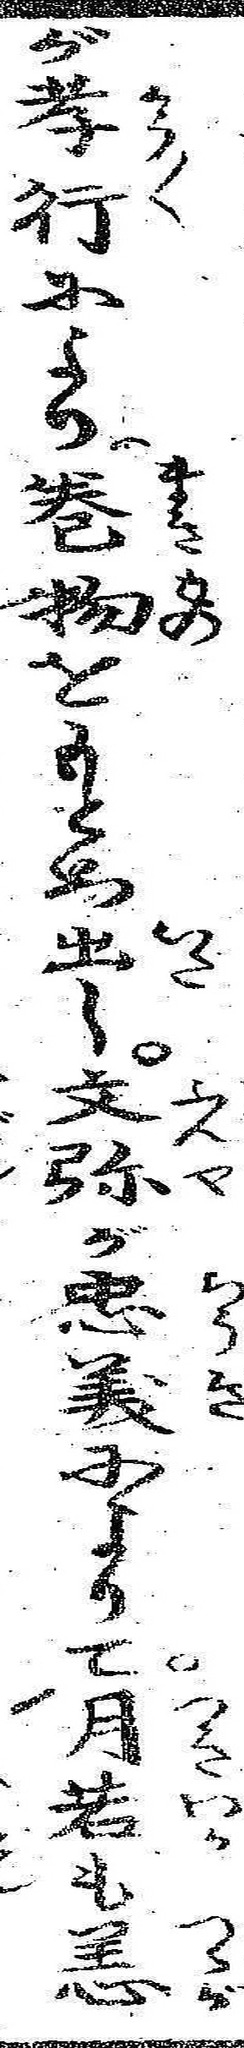が孝行により。巻物をもとめ出し。文弥が忠義によりて。月若も恙
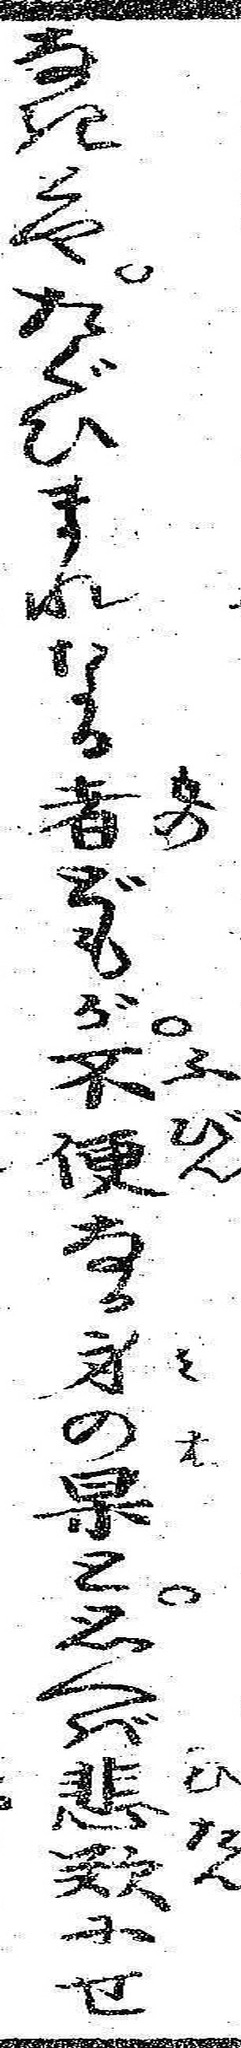なきとや。たぐひまれなる者どもが。不便なる身の果と。思へば悲歎にせ
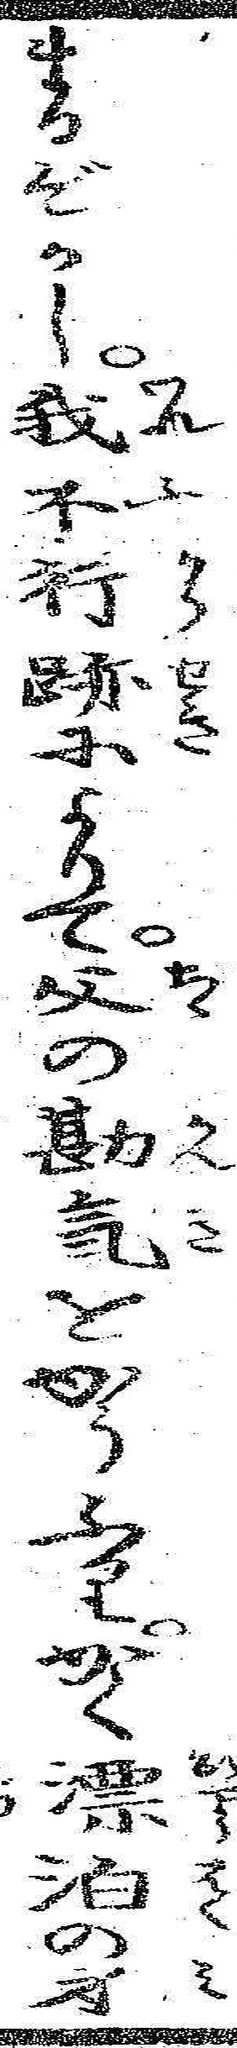まるぞかし。我不行跡によりて。父の勘気をかうふり。かく漂泊の身
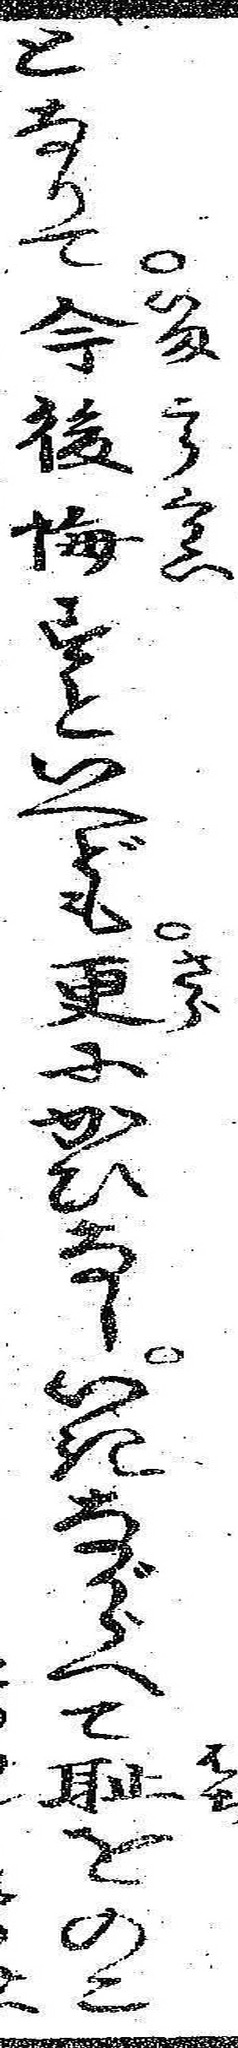となりて。今後悔すといへども。更にかひなし。いきながらへて恥をのこ
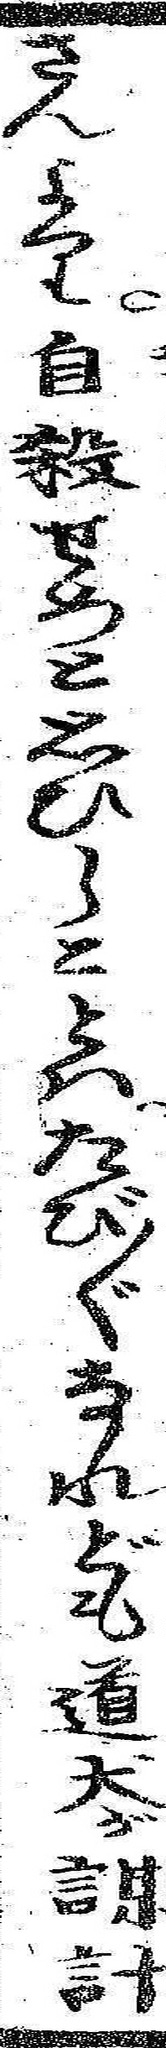さんより。自殺せめと思ひしことは。たび〴〵なれども。道犬が謀計
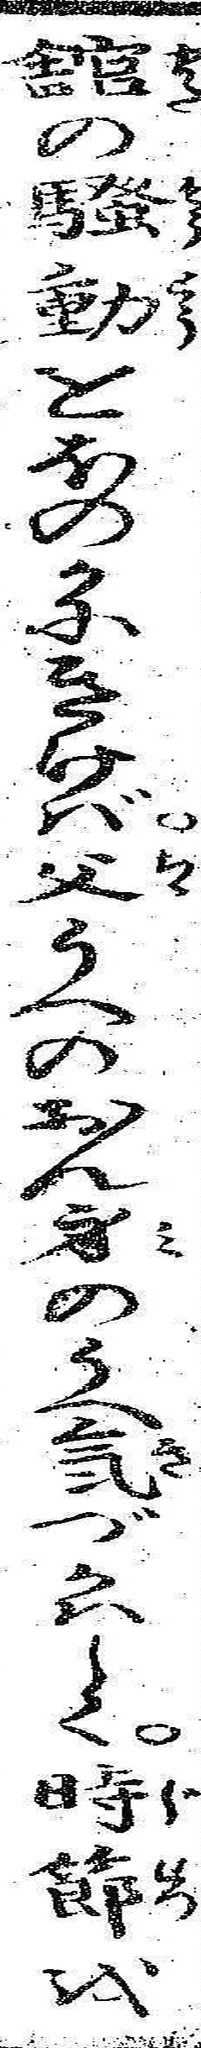館の騒動をほのかにきけば。父うへのおん身のうへ気づかはしく。時節を
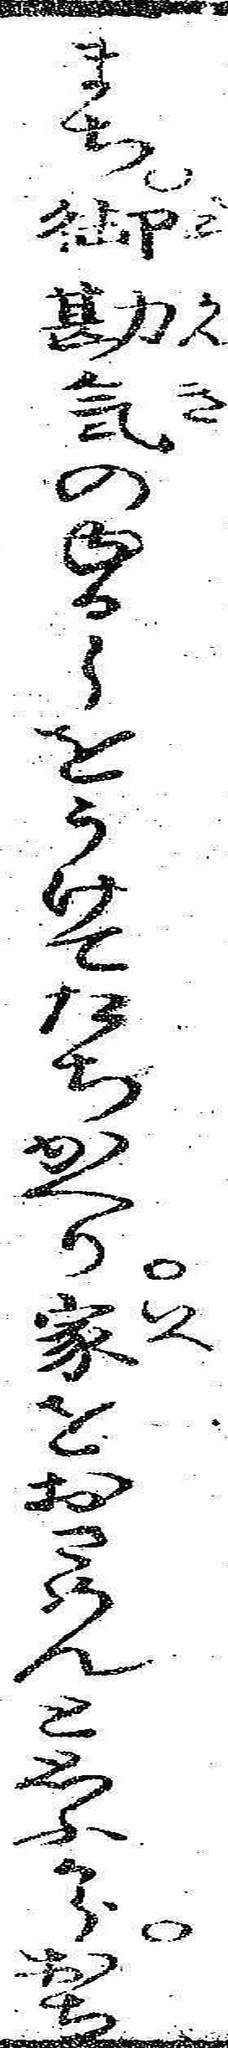まち。御勘気のゆるしをうけてたちかへり。家をおさめんと思ふから。おち
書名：昔話稲妻表紙
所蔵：国文学研究資料館
